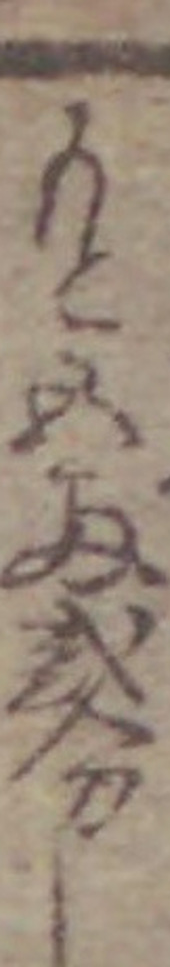もと五両貳分
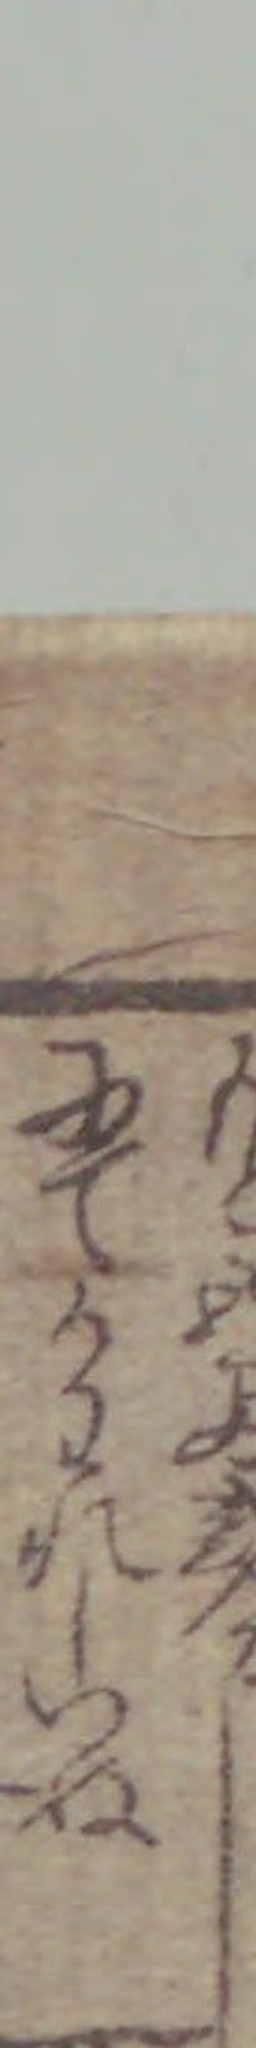にてかわれしいぬ
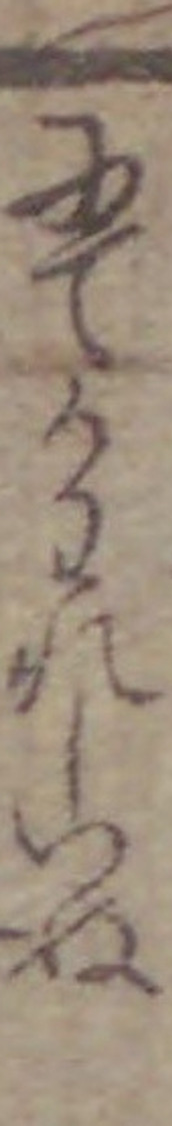にてかわれしいぬ
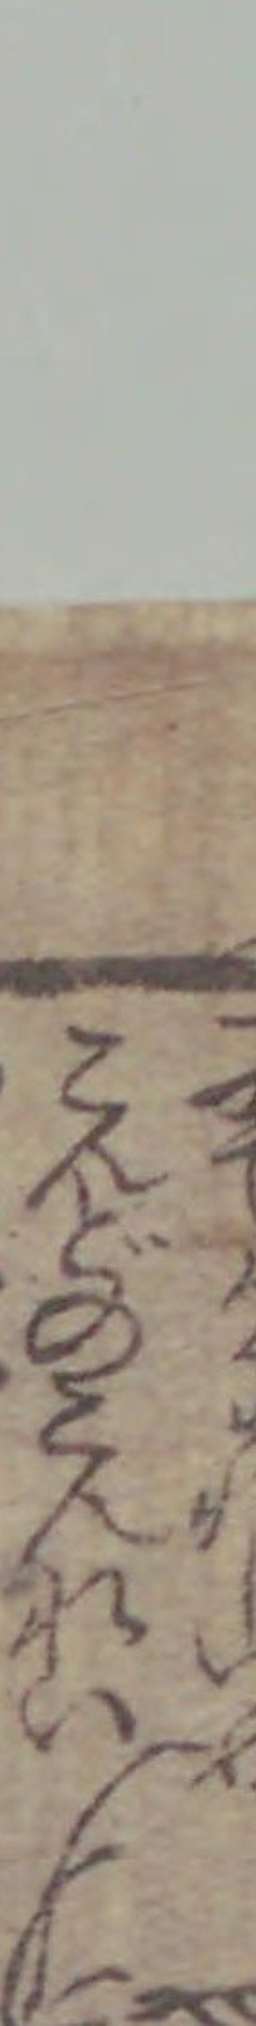こんどのこんれい
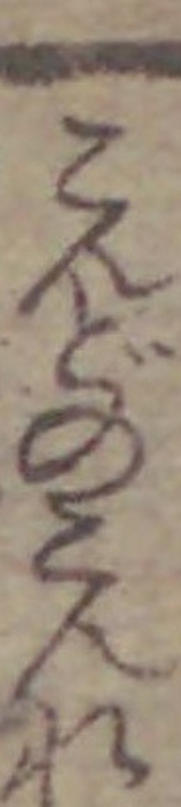こんどのこんれい
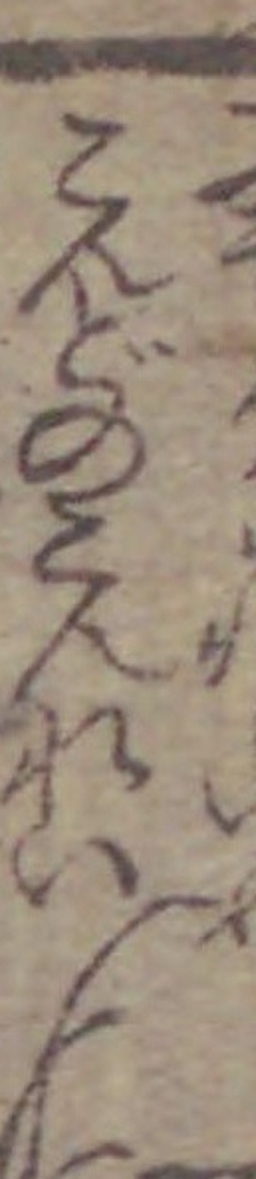こんどのこんれい
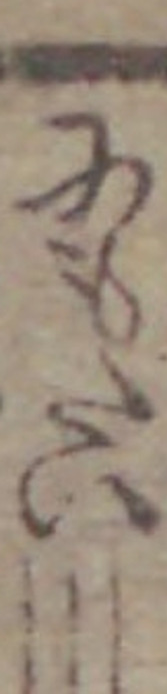にもたい
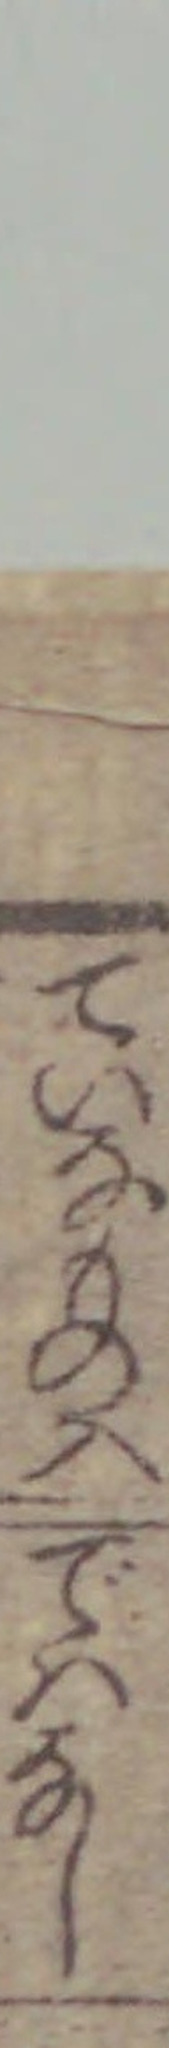ていなもの入ではなし
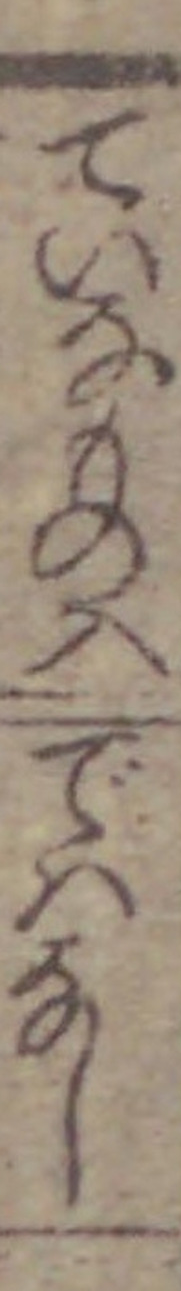ていなもの入ではなし
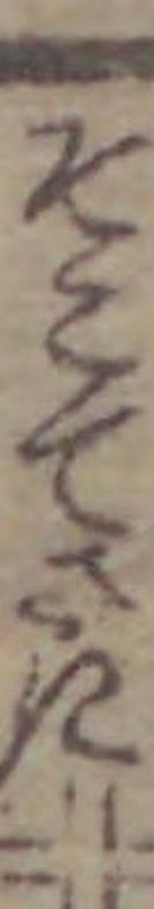そこてさき
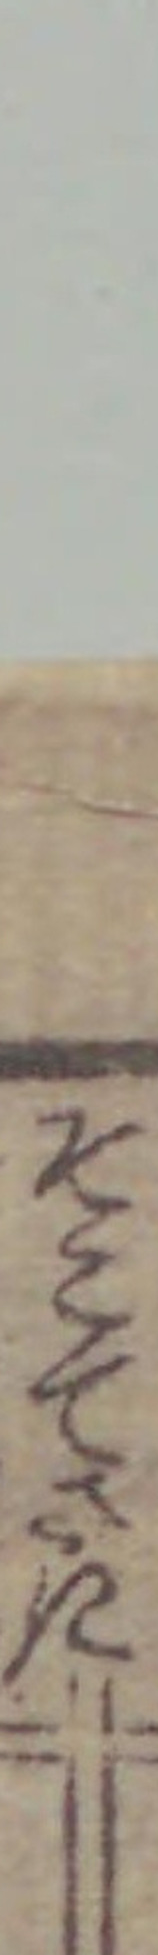そこてさき
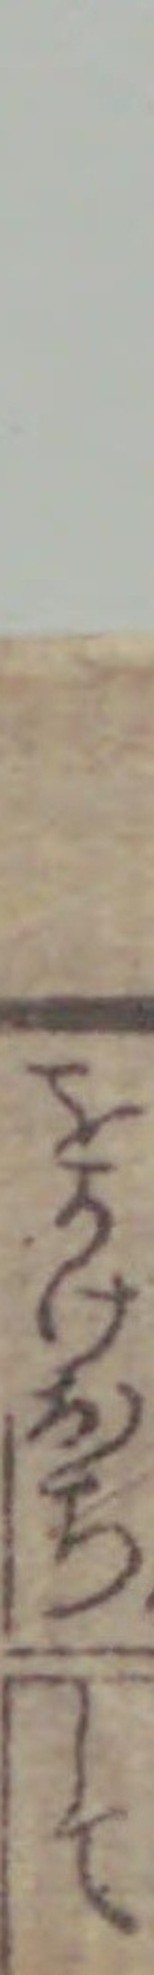をかけおちして
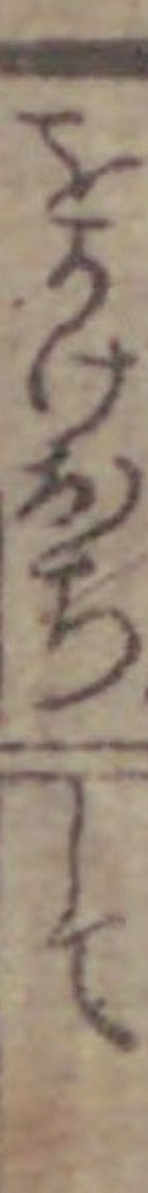をかけおちして
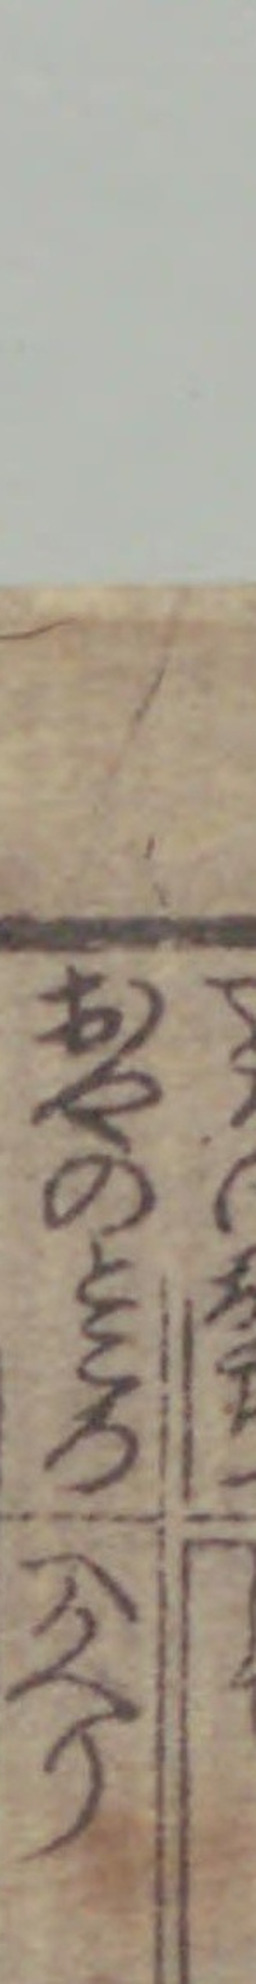おやのところへかへり
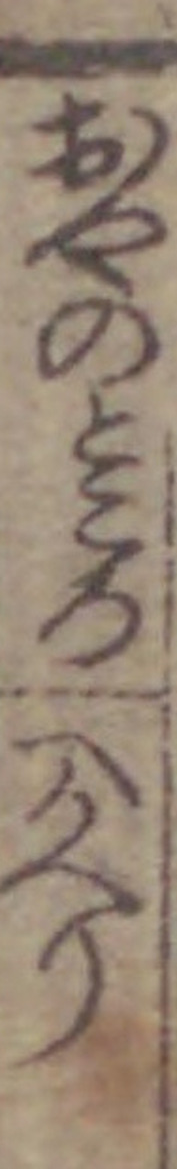おやのところへかへり
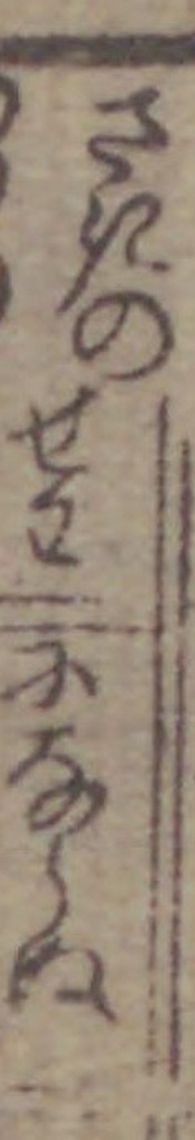さきのせわにならぬ
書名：狆の嫁入 2巻
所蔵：国立国会図書館 National Diet Library, JAPAN
